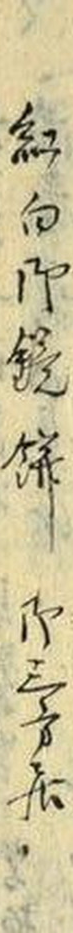紅白御鏡餅御三方居
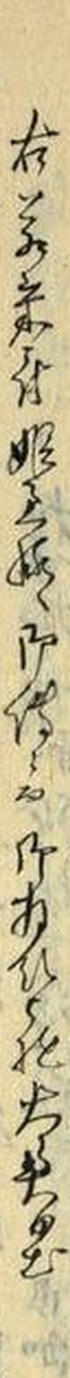右若菜ニ付姫君様へ御伝ニ而御拝領被遊大奥ゟ出
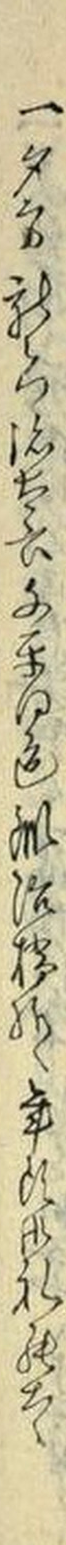一夕方新右衛門弥太六文平同道鍛冶橋様へ年始御礼罷出候
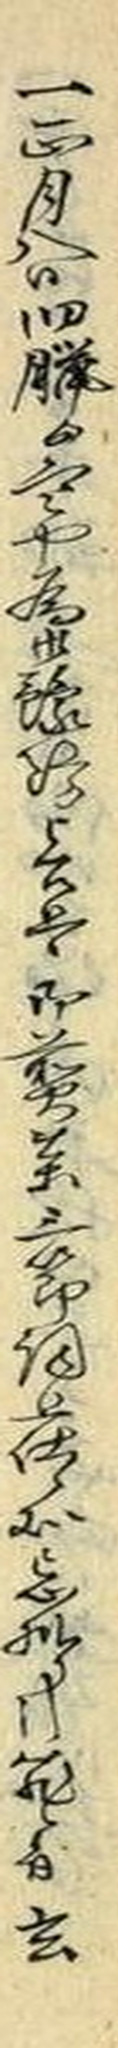一正月八日旧臘ゟ寒中為御予防被召上候御煎薬三節伺上仕候処忘掛引籠候ニ付玄
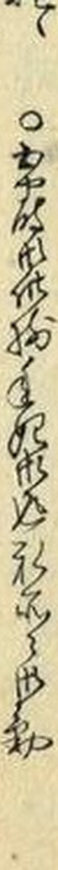○五半時御供揃年始御返礼所々御勤
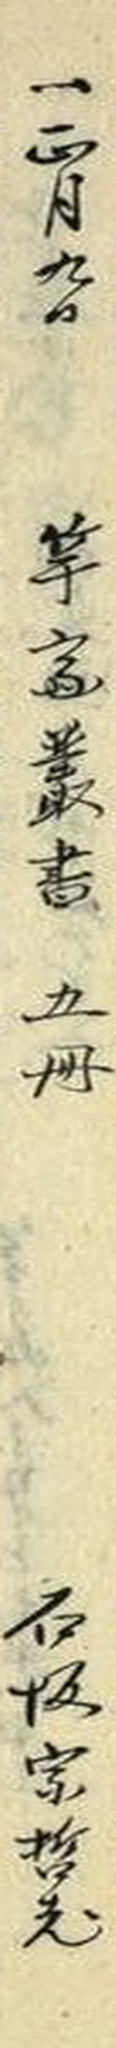一正月九日竿斎叢書五冊石坂宗哲老
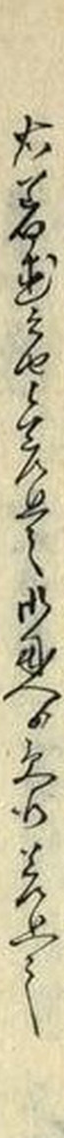右著述之由差上之御用人ゟ受取差上之
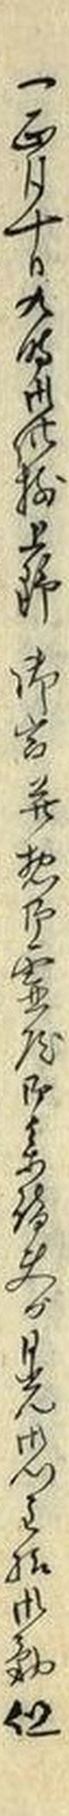一正月十日九時御供揃上野御宮并惣御霊屋御参詣夫ゟ日光御門主様御勤但
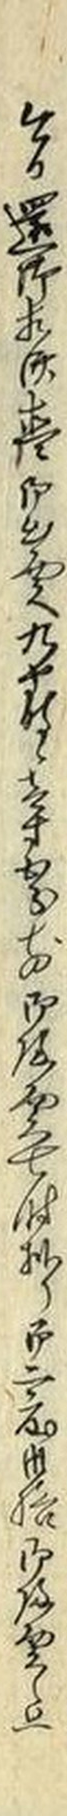今日還御相済直ニ御出殿九半時へ壱寸五分前御帰殿七時掛り御二度御膳御帰殿之上
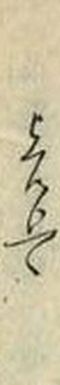被召上候
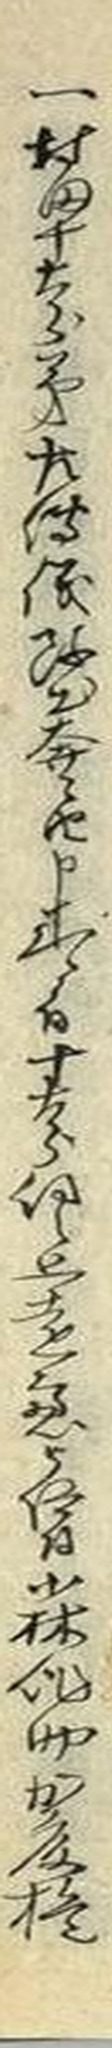一村田十太郎弟左伝儀致出奔候由申来候ニ付十太郎伺之上遠慮被仰付小林作助加藤権
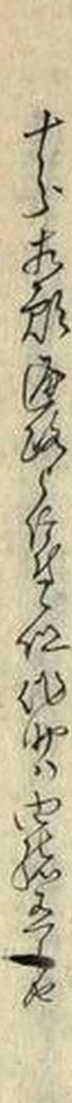十郎相願通路被仰付候但作助ハ由緒有之由
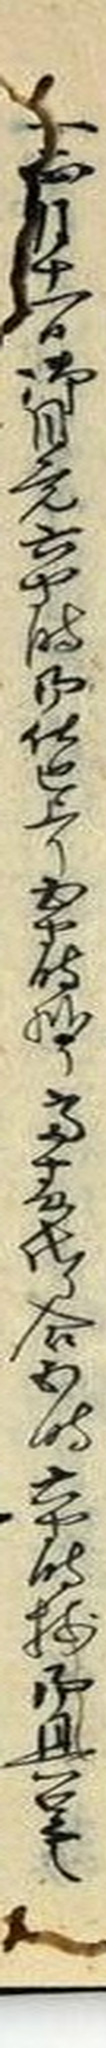一正月十一日御目覚六半時御仕廻上り五半時掛り当番代り合五時六半時揃御具足
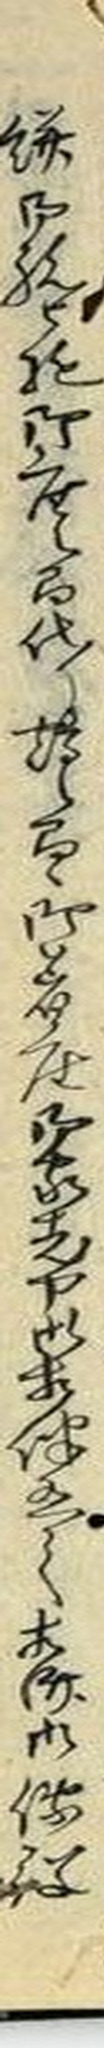餅御祝被遊御座之間代り鶴之間御着座御家老中御相伴有之相済御傅役
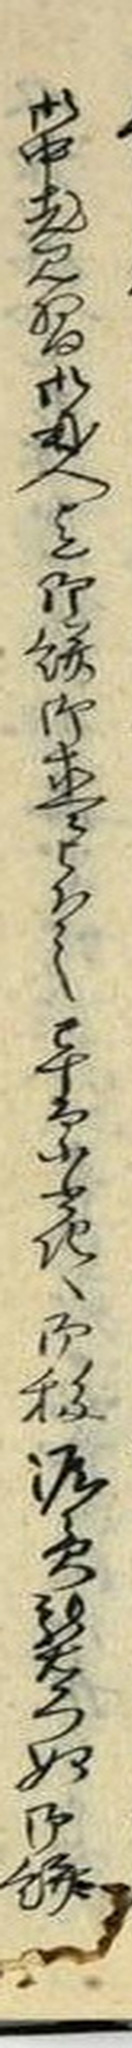御中老見習御用人迄御餅御直々被下之畢而小書院へ御移渥美新右衛門始御餅

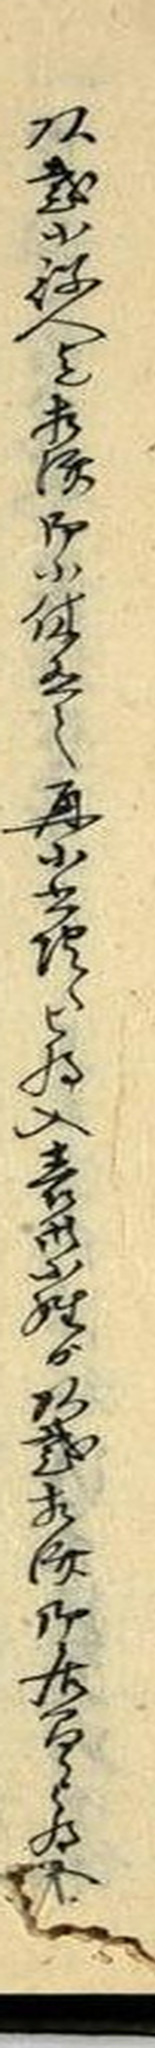頂戴小役人迄相済御小休有之再小書院へ被為入表御小姓ゟ頂戴相済御居間へ被為入
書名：少傅日録抄（斉承付側向頭取日記、在府）
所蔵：福井県文書館 Fukui Prefectural Archives
